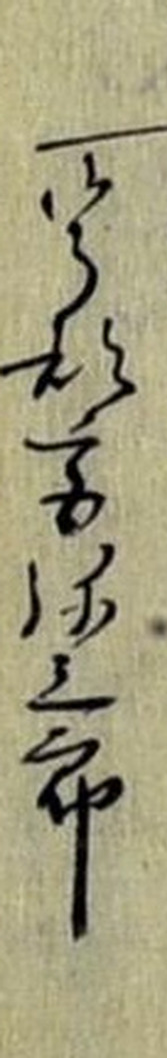宇都宮弥三郎
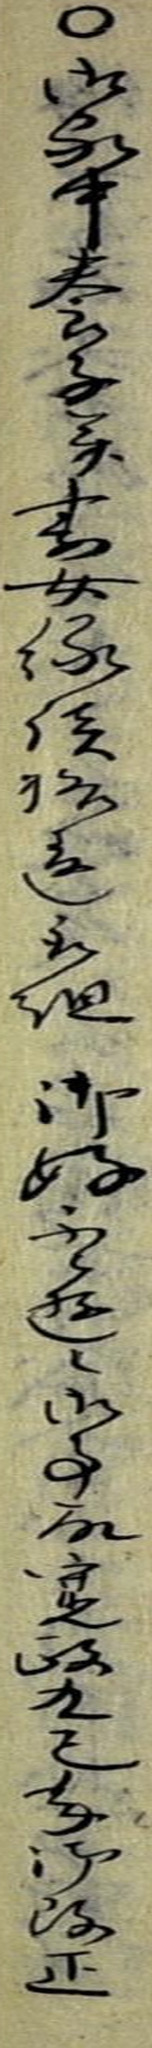○御家中養子并妻女縁談格違取組御好不被遊候御事故寛政九巳年御改正
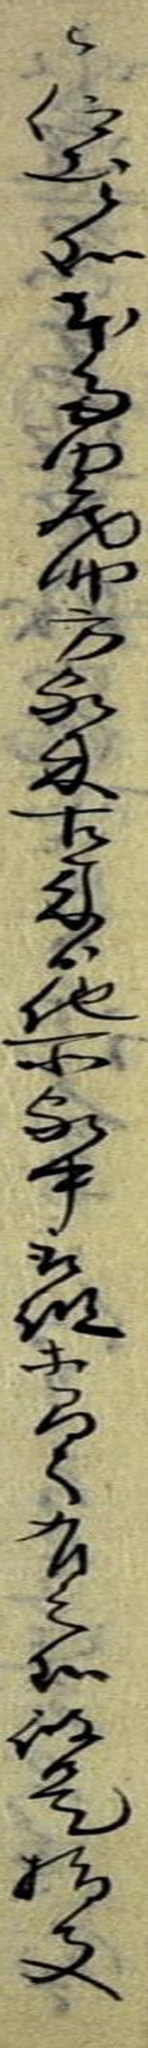被仰出候処本多内蔵助方家来古来ゟ他所家中取組等間々有之候処彼是指支
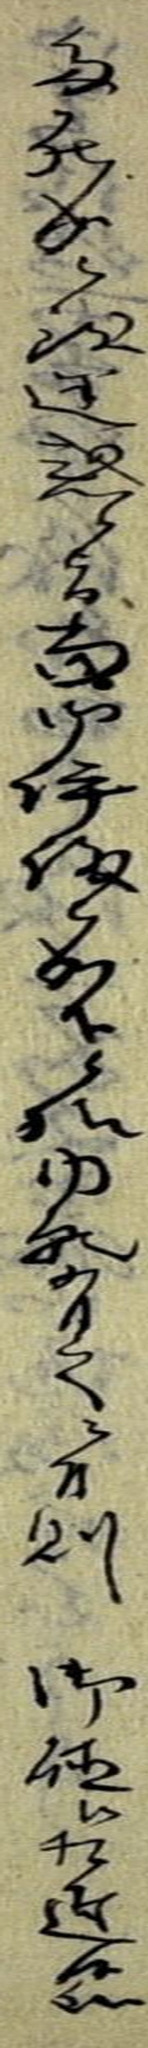多罷成候致迷惑候旨当御評儀被成下候様内願有之に付則御聴被相達候処
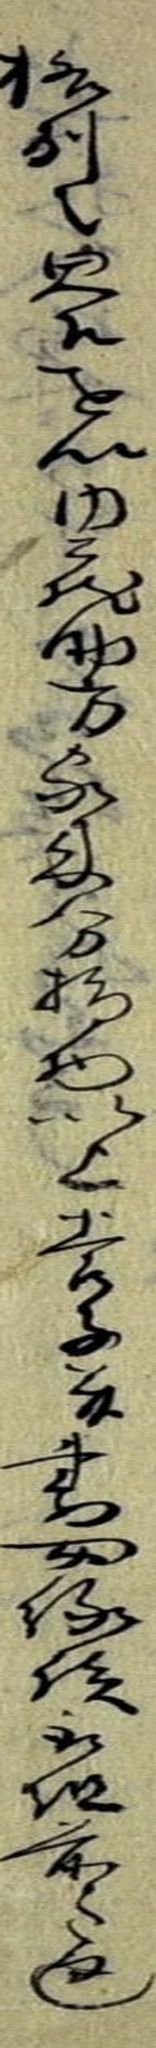格別之思召を以内蔵助方家来分指物以上養子并妻女縁談取組前々之通
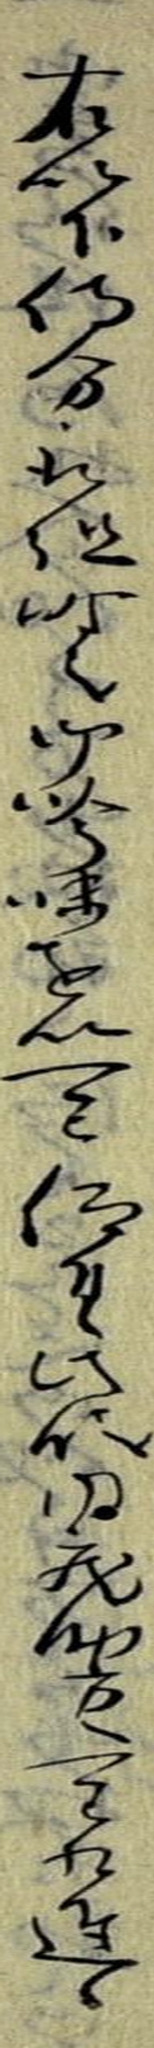右以下侍分取組時之御吟味を以可被仰付候此段内蔵助方へ可被相達候
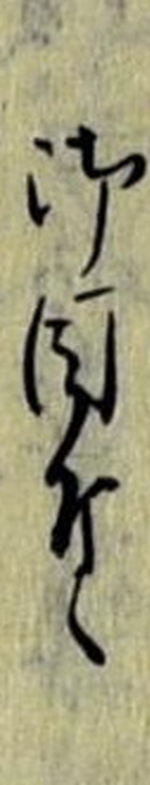御目付へ
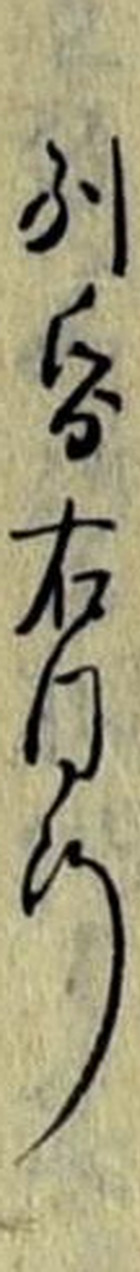別紙右同断
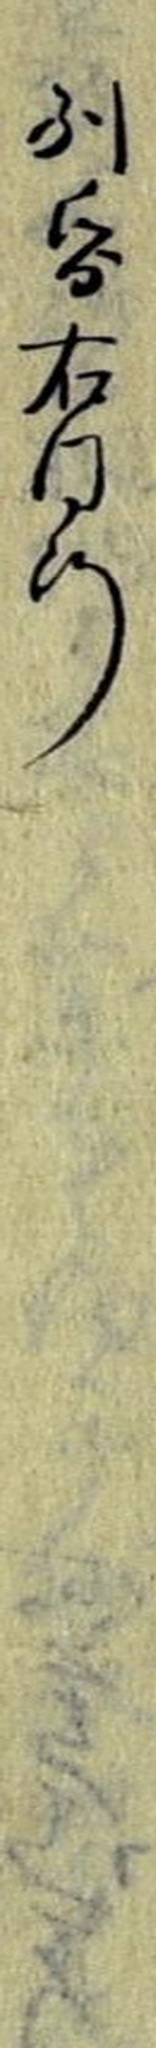別紙右同断
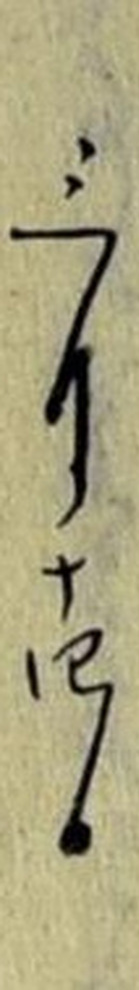三月十四日
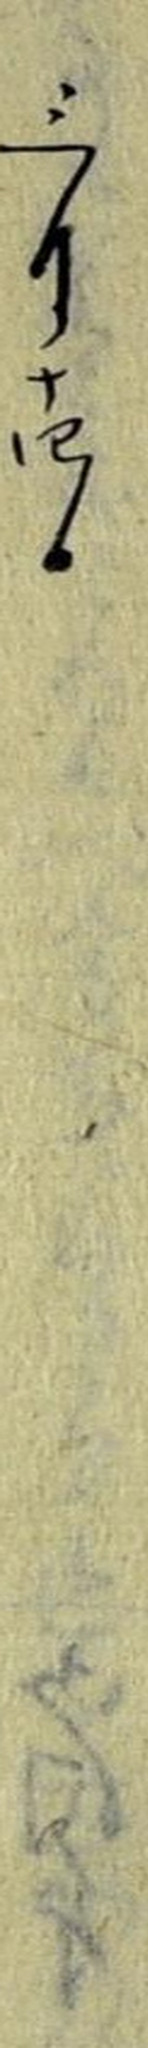三月十四日
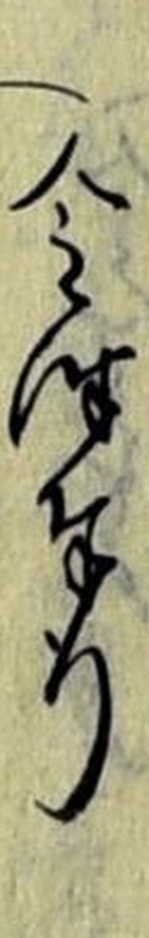金津奉行
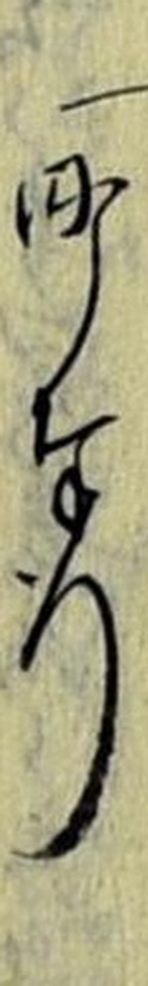町奉行
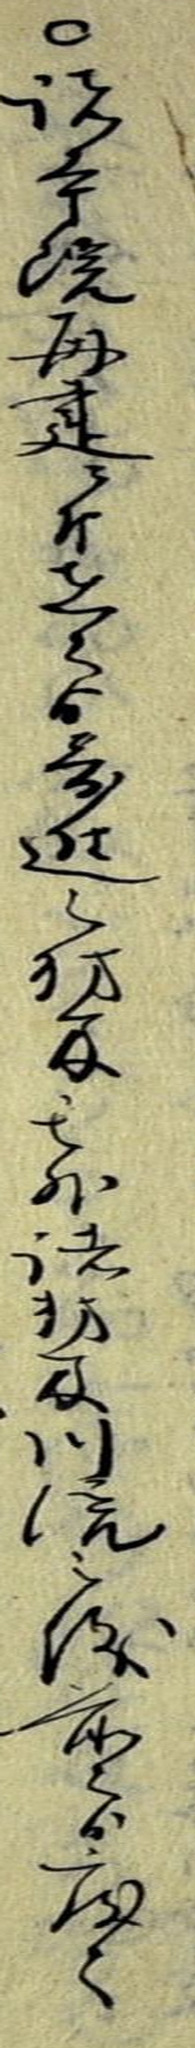○諸寺院再建に付在々ゟ寄進之材木其外諸材木川流之儀前々ゟ度々
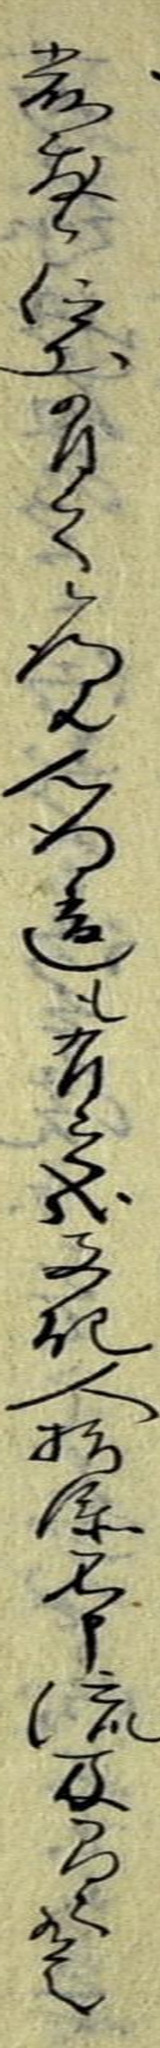厳敷被仰出有之候得共心得違も有之哉支配人指添不申流木間々有之
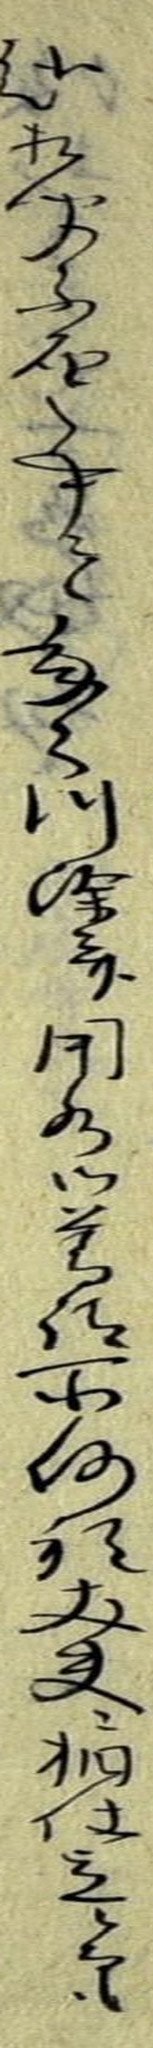趣相聞不届之事に候年々川除并用水御普請所何程丈夫に相仕立候而も
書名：命令之部 四
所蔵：福井県文書館 Fukui Prefectural Archives
